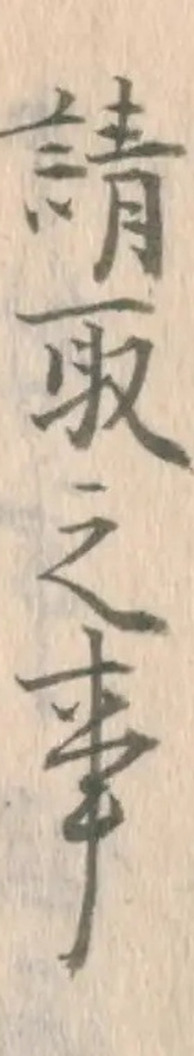請取之事
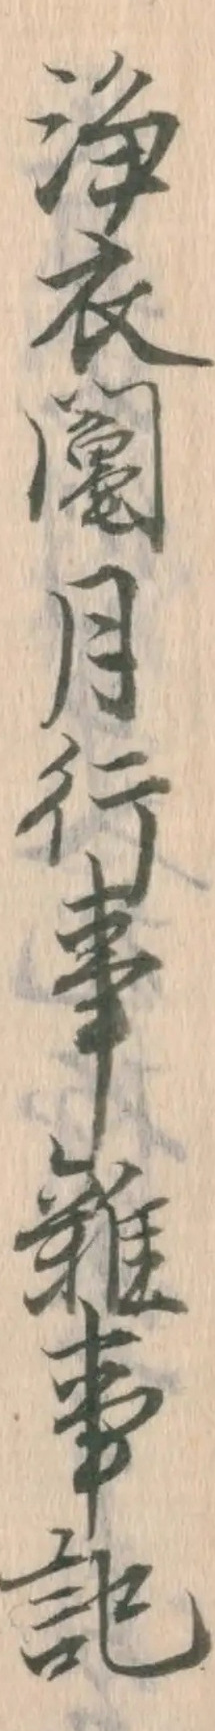浄衣鬮月行事雑事記
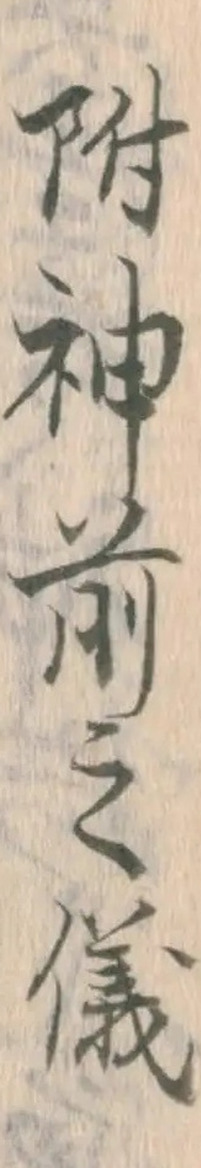附神前之儀
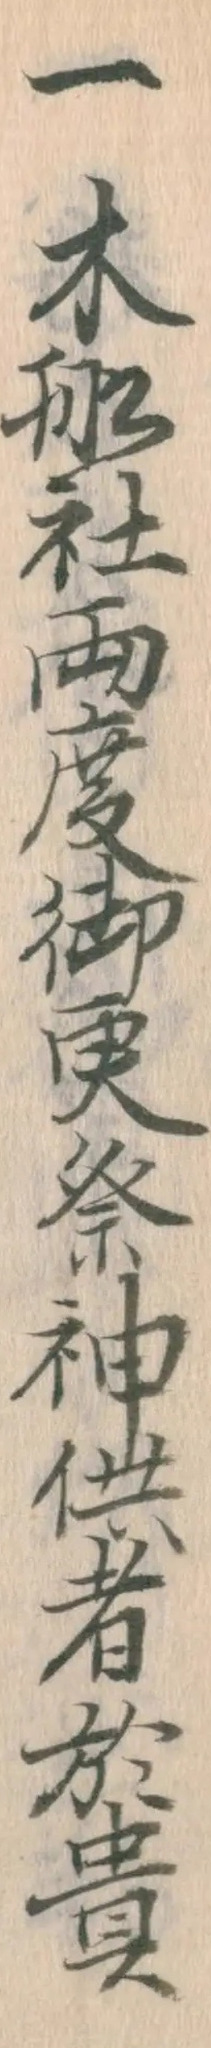一木船社両度御更祭神供者於貴
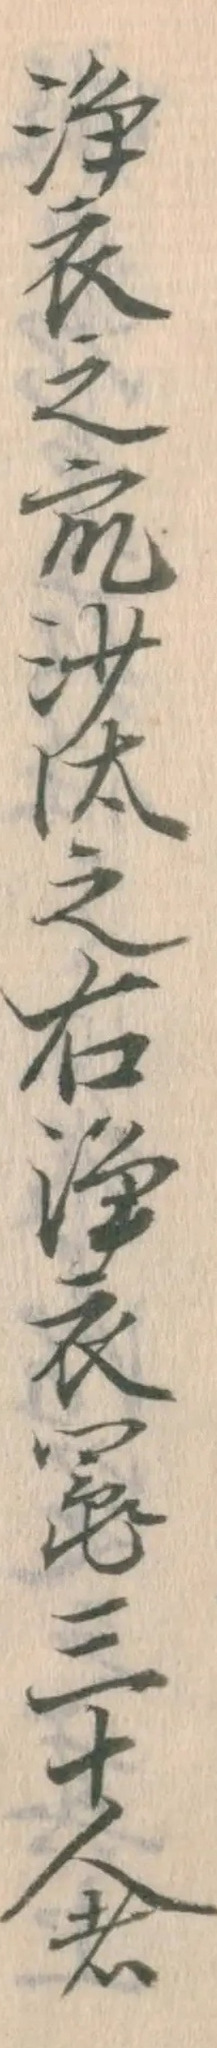浄衣之衆沙汰之右浄衣鬮三十人者
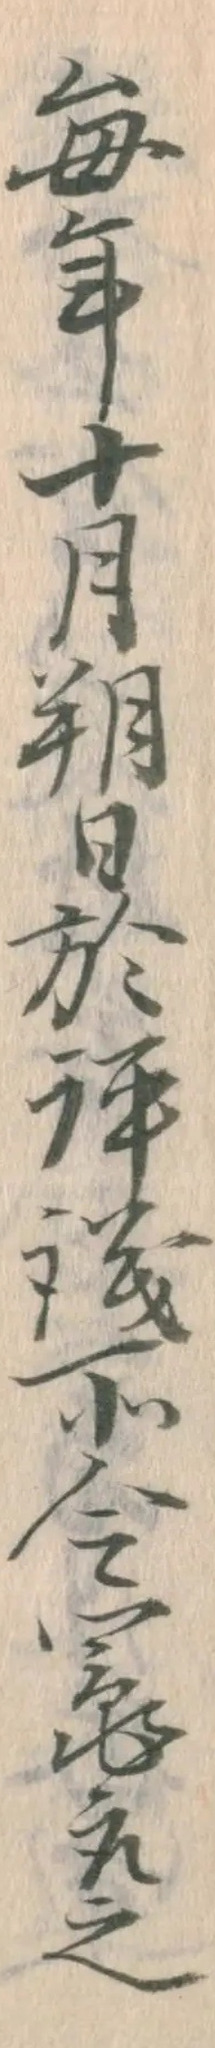毎年十月朔日於評議所令鬮取之
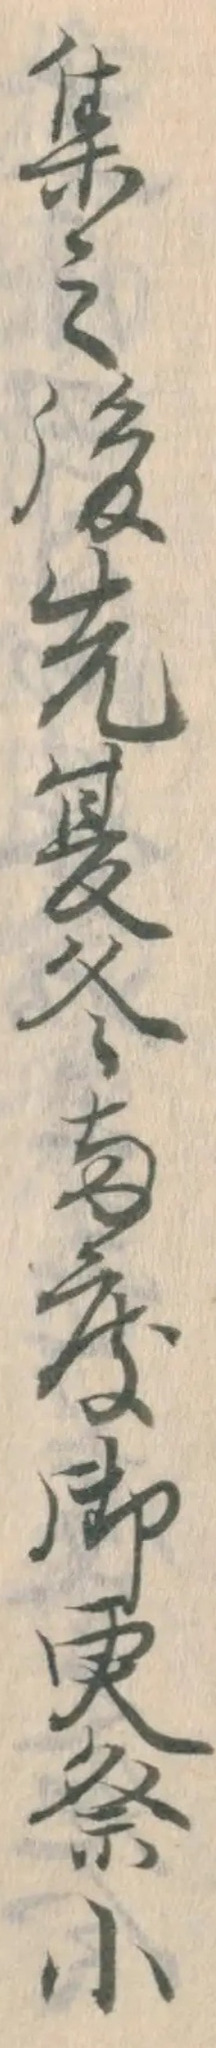集之後先夏冬両度御更祭小
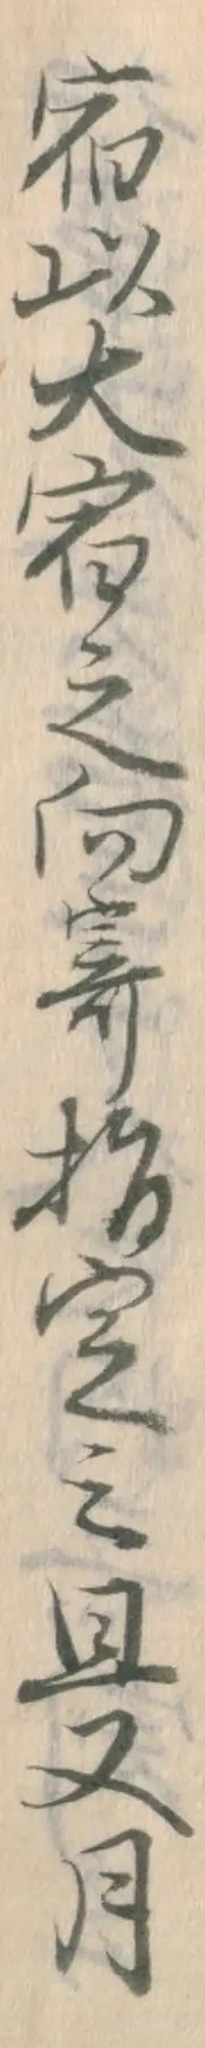宿以大宿之向寄指定之且又月

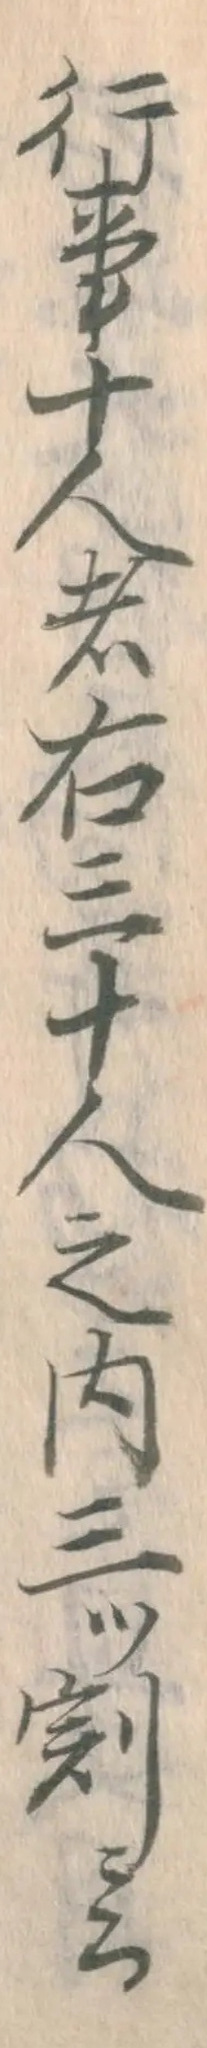行事十人者右三十人之内三ツ割ニ而
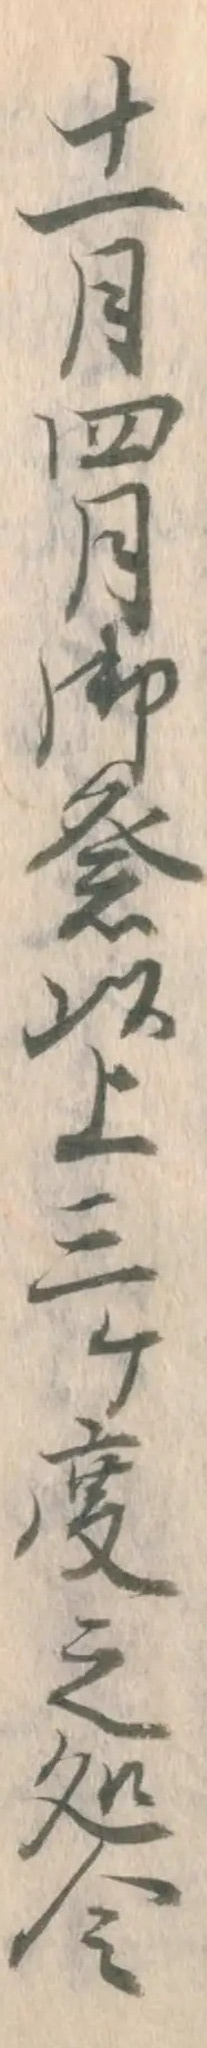十一月四月御登以上三ヶ度之処令
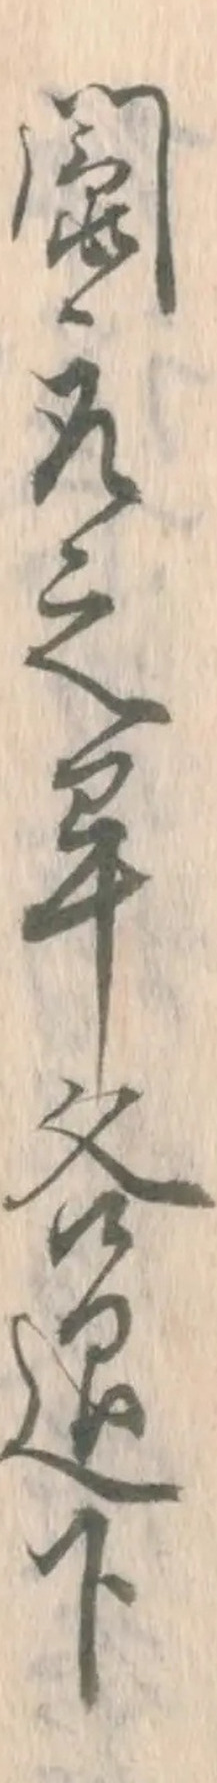鬮取之畢各退下
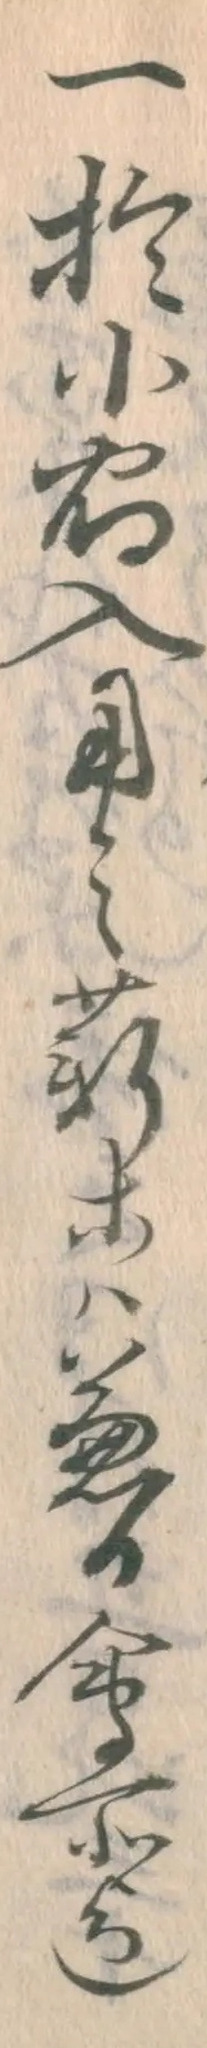一於小宿入用之薪等は兼而会所迄
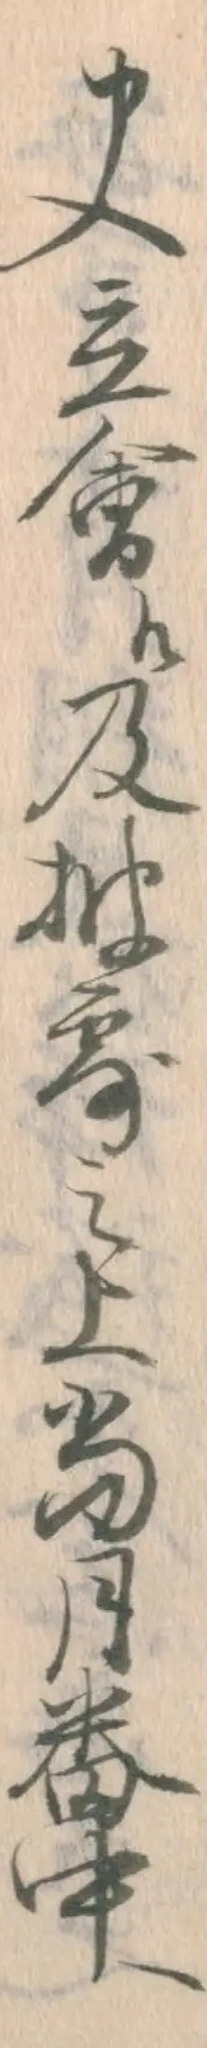申入立会候及披寄之上当月番中へ
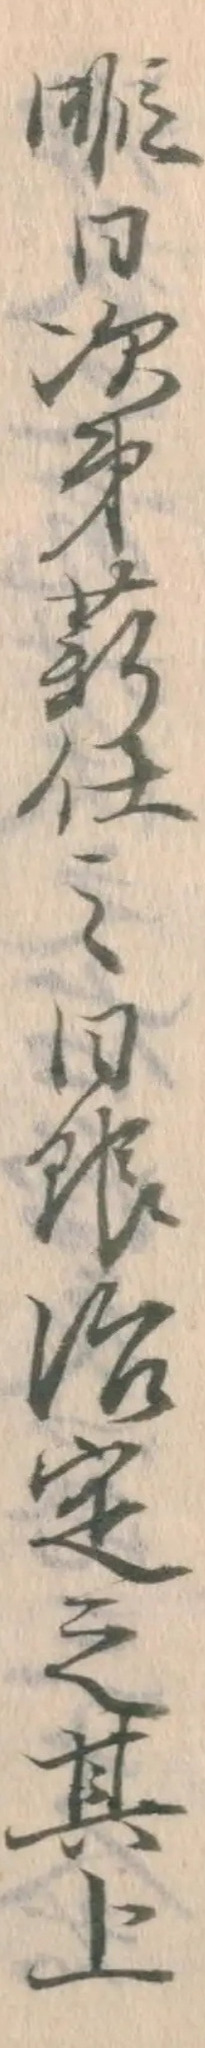暇日次第薪仕之日限治定之其上
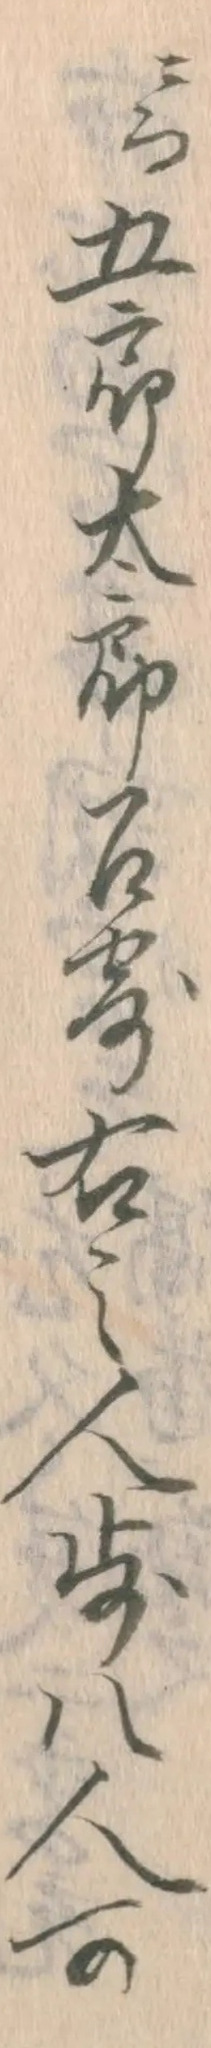ニ而五郎太郎召寄右之人歩八人可
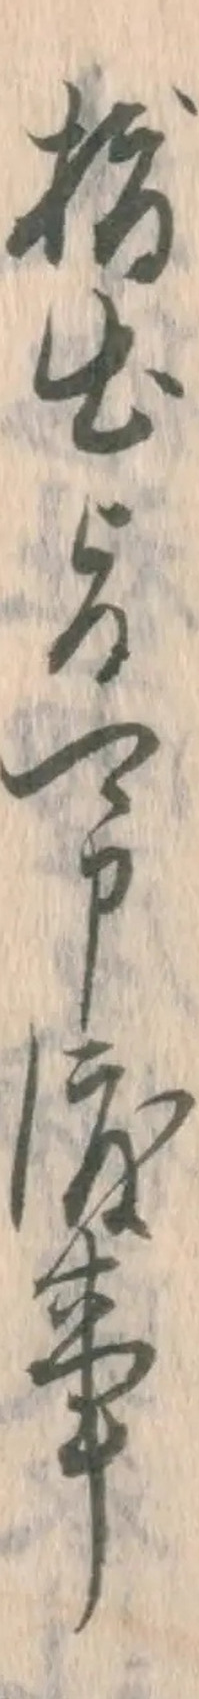指出旨可申渡事
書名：賀茂社記録. 第81冊
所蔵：国立国会図書館 National Diet Library, JAPAN
